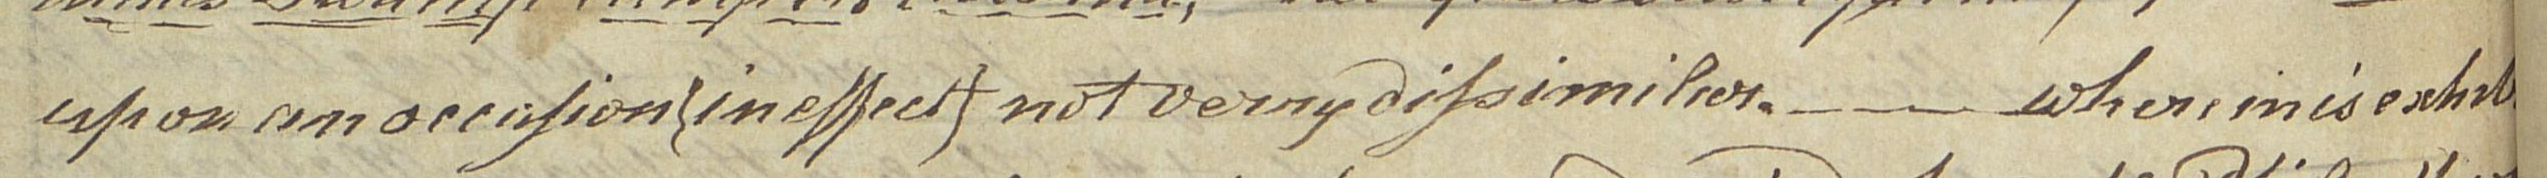upon an occasion (in effect) not verry dissimilar. wherein is exha-
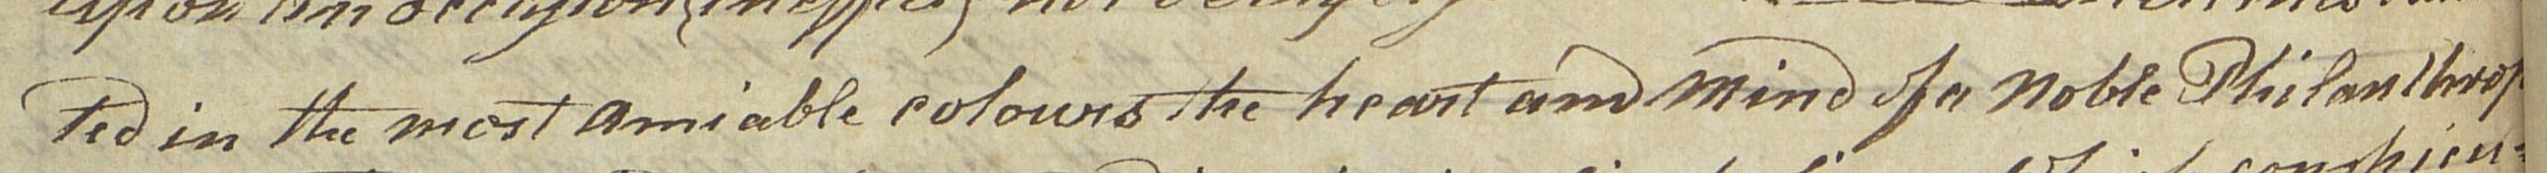-ted in the most amiable colours the heart and Mind of a Noble Philanthrop-
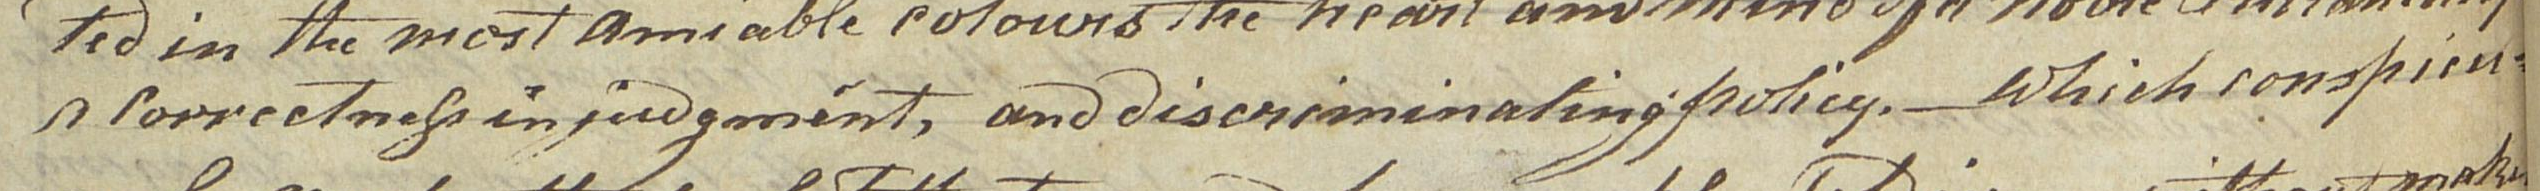a Correctness in judgment, and discriminating policy. Which conspicu-
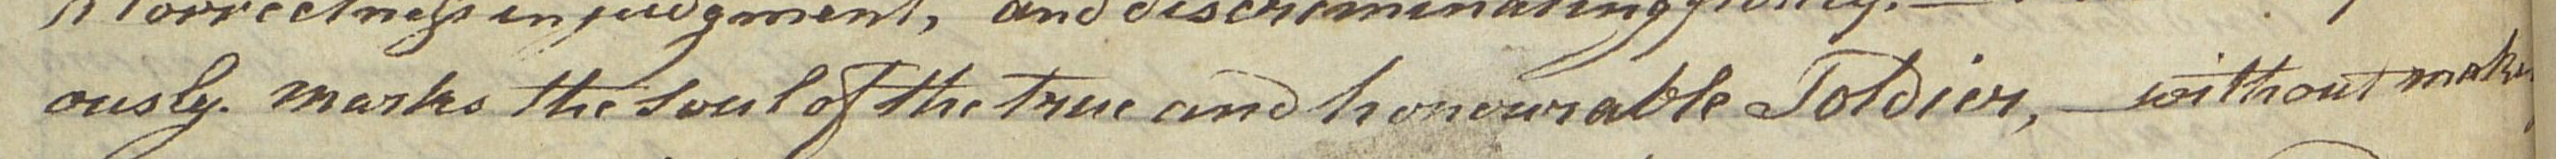-ously. Marks the soul of the true and honourable Soldier, without make
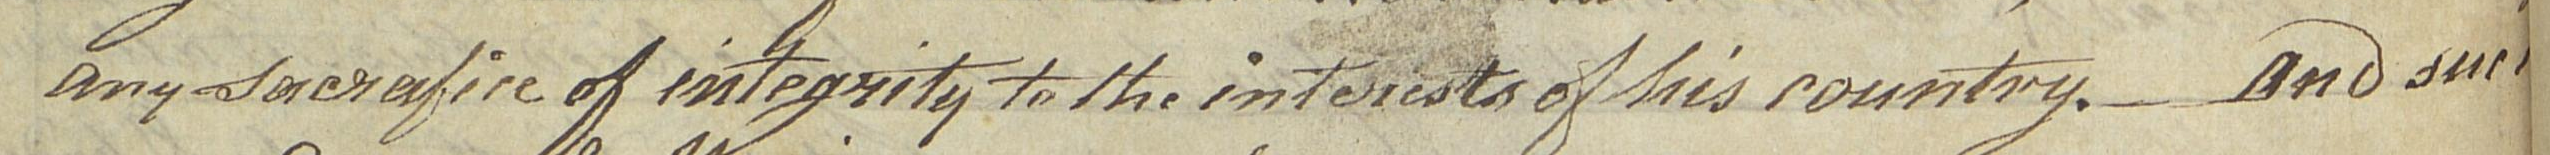any sacrafice of integrity to the interests of his country. and such
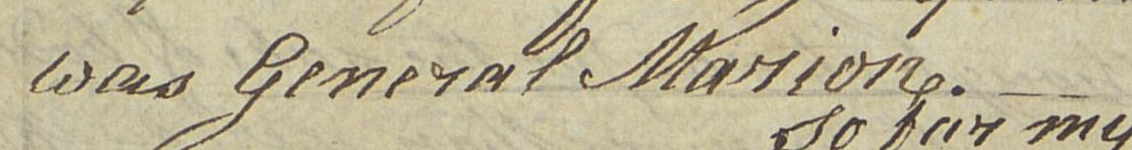was General Marion.
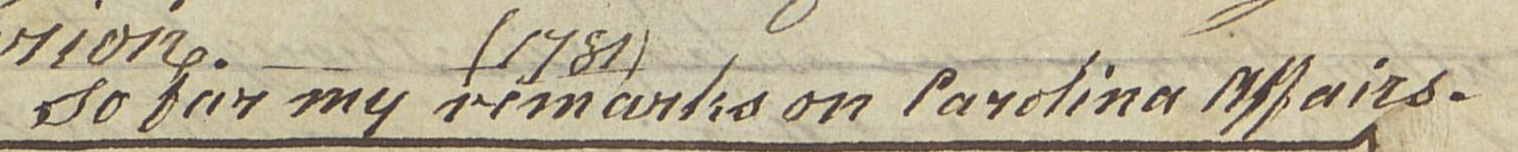so far my remarks on Carolina Affairs.
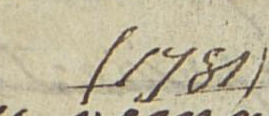(1781)
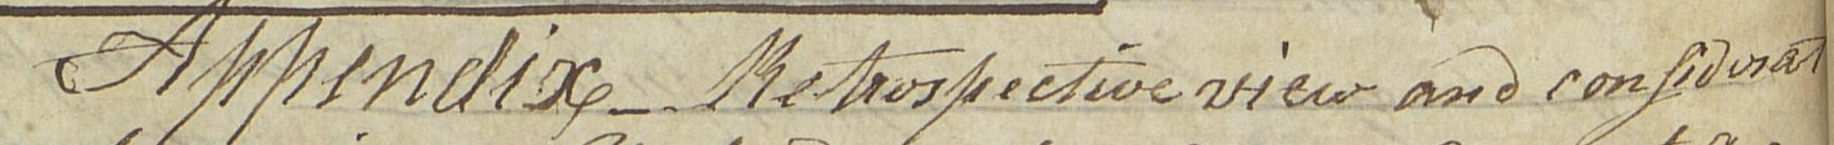Appendix Retrospective view and considerat-
